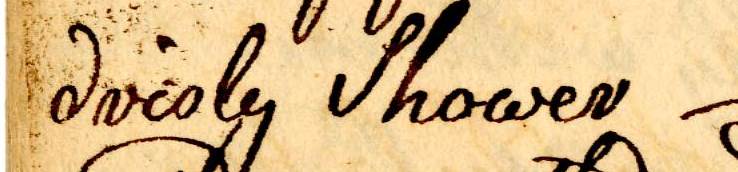drisly Shower
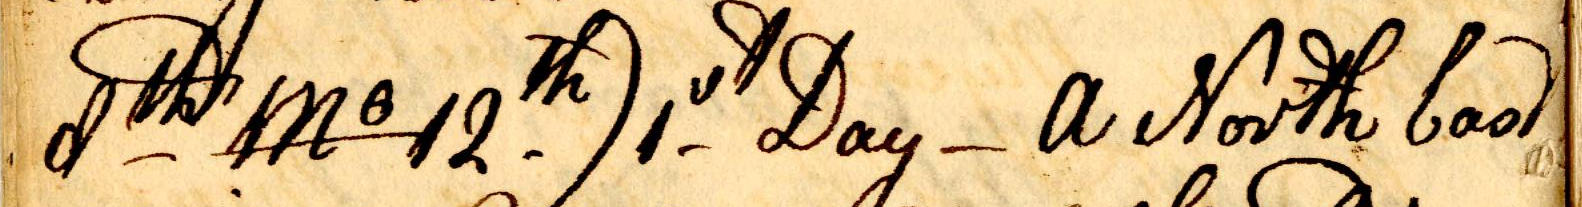8^th M^o 12^th) 1^st Day- A North East
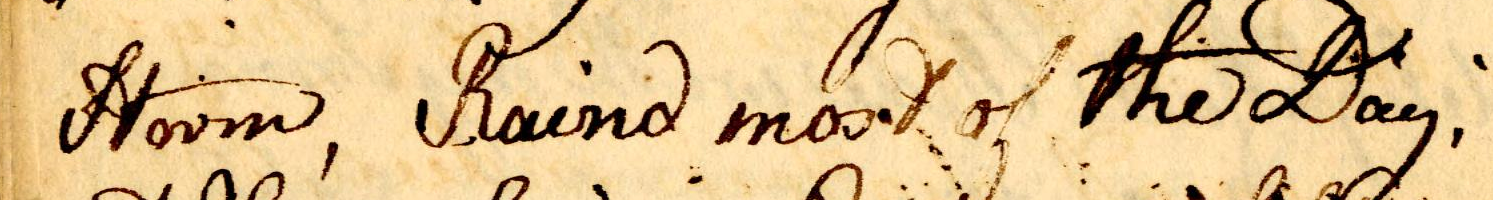Storm, Raind most of the Day,
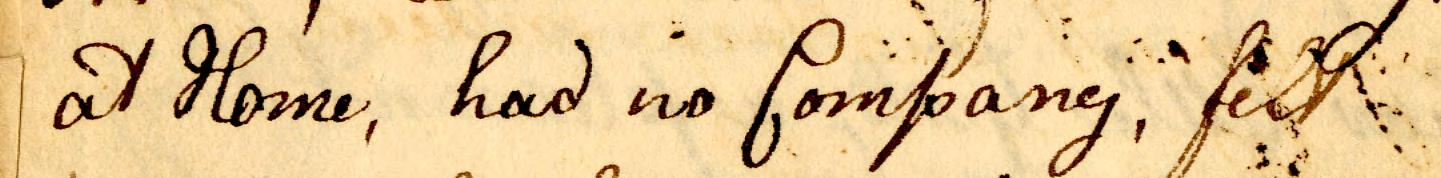at Home, had no Company, felt
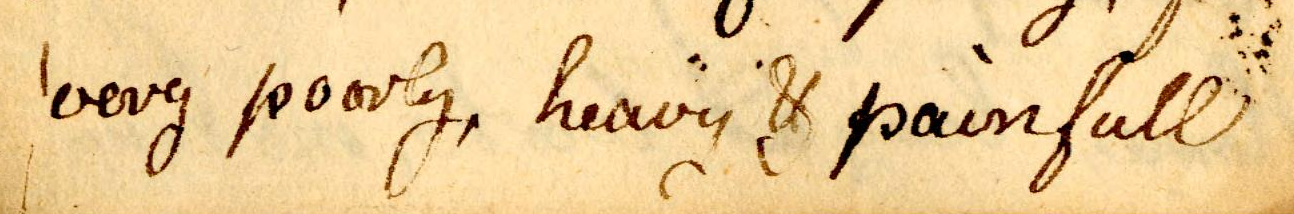very poorly, heavy & painfull
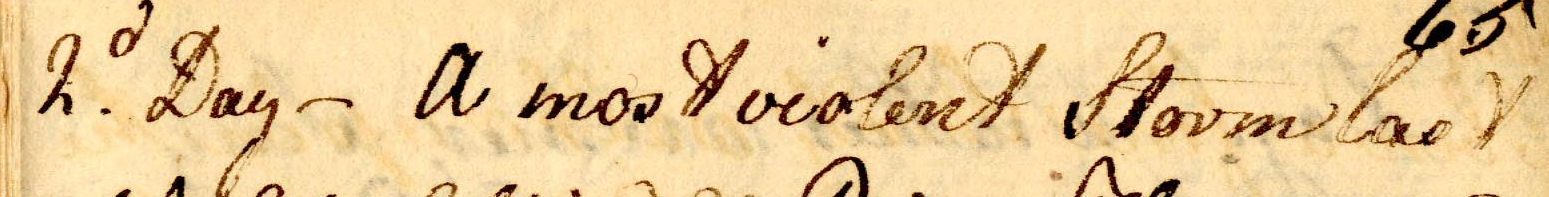2^d. Day- A most violent Storm last
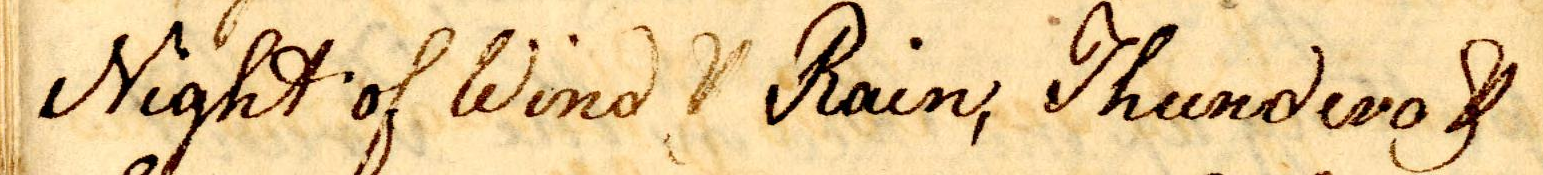Night of Wind & Rain, Thunders &
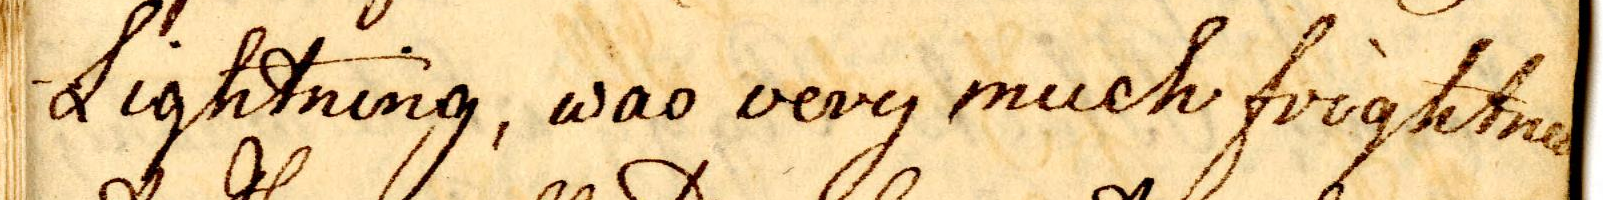Lightning, was very much frightne
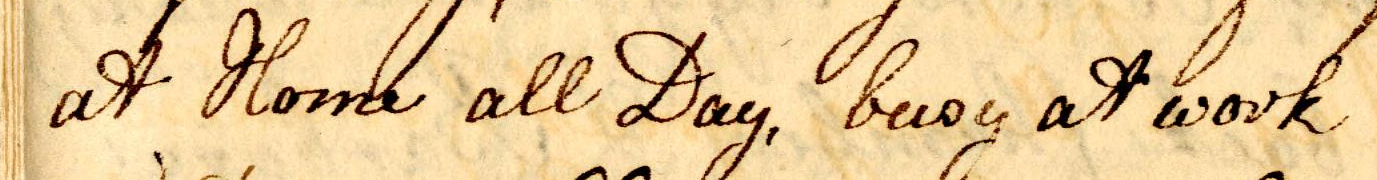at Home all Day, busy at work
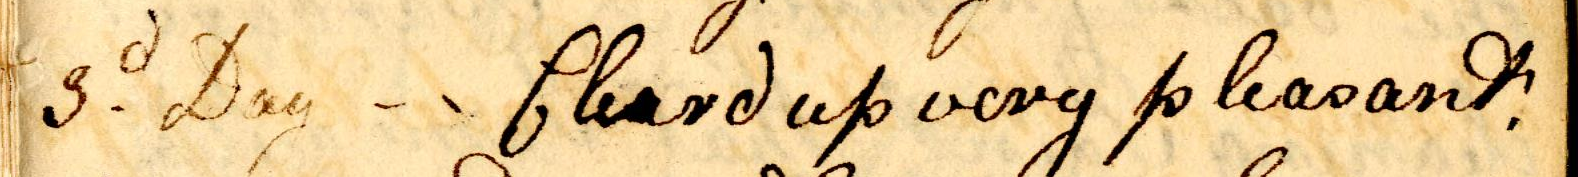3^d. Day- Cleard up very pleasant,
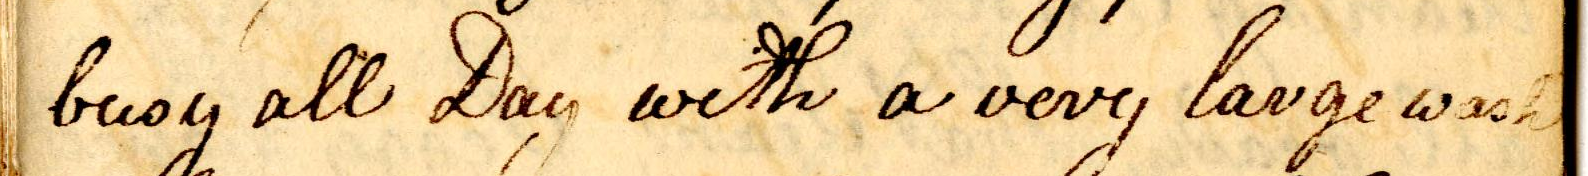busy all Day with a very large wash
